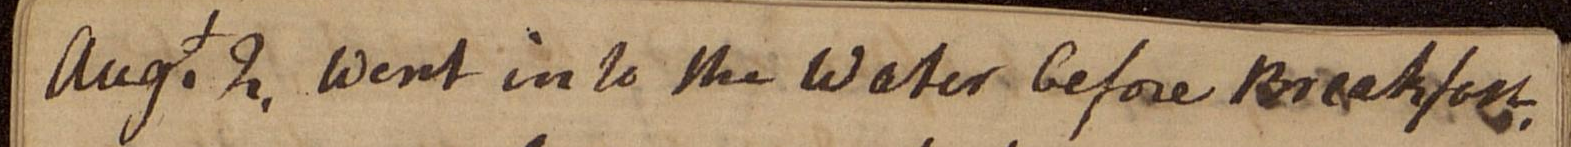Aug^t. 2. went into the Water before Breakfast.
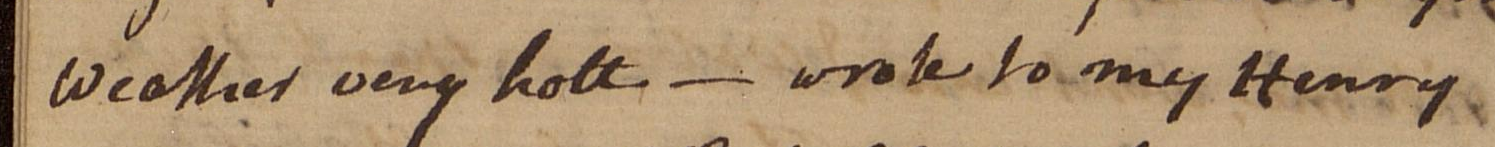Weather very hott- wrote to my Henry
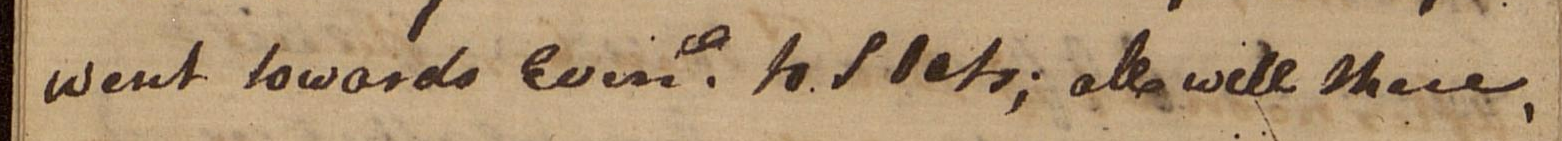went towards Even^g. to S Oats; all well there,
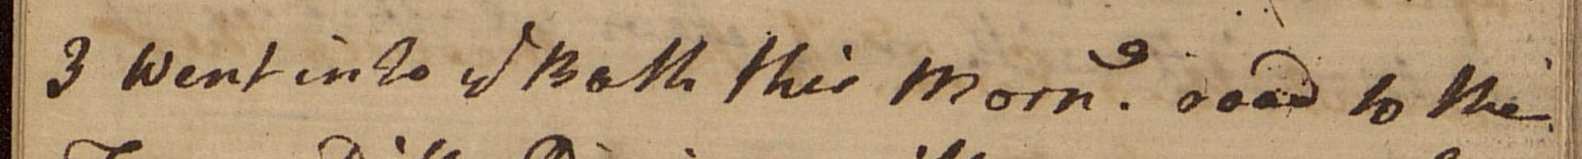3 went into y^e Bath this Morn^g. road to the
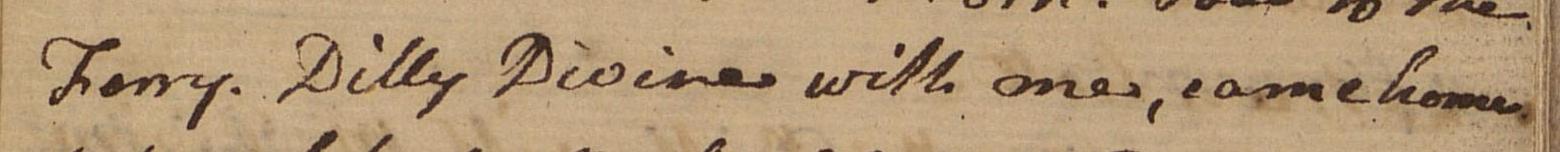Ferry. Dilly Divine with me, came home
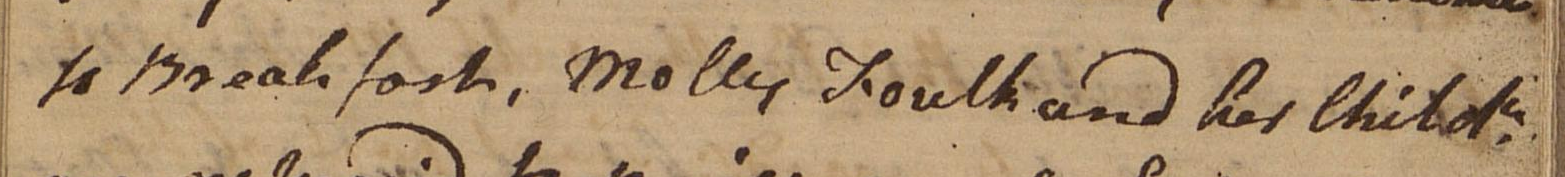to Breakfast, Molly Foulk and her Child^n.
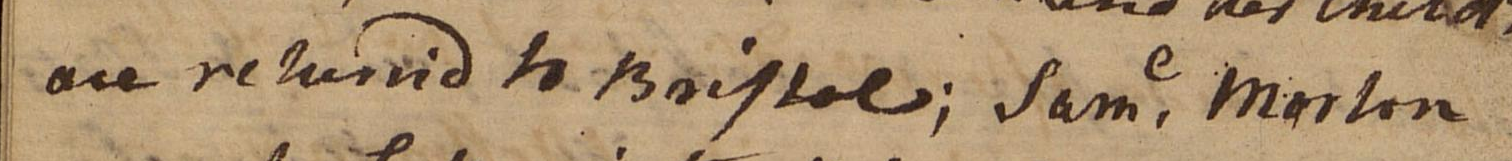are return'd to Bristol; Sam^l, Morton
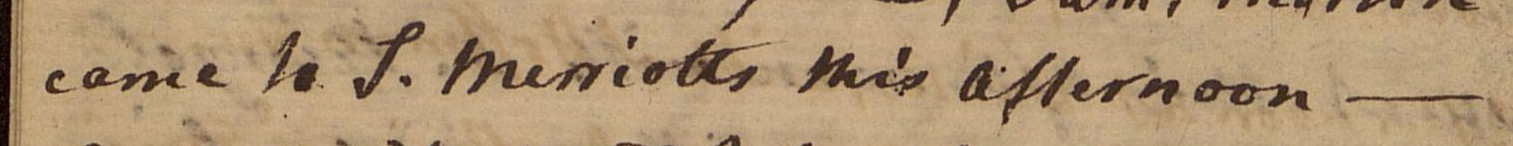came to S. Merriotts this afternoon-
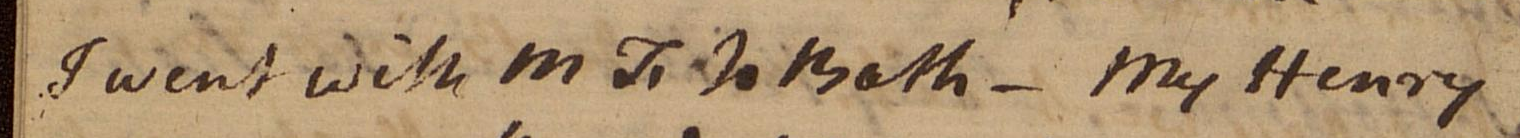I went with M F. To Bath- My Henry
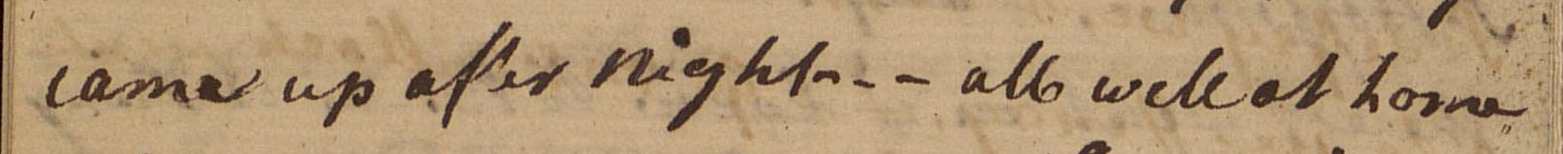came up after night-- all well at home
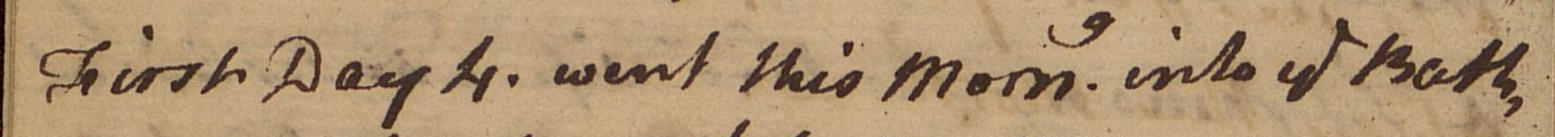First Day 4. went this morn^g. into y^e Bath,
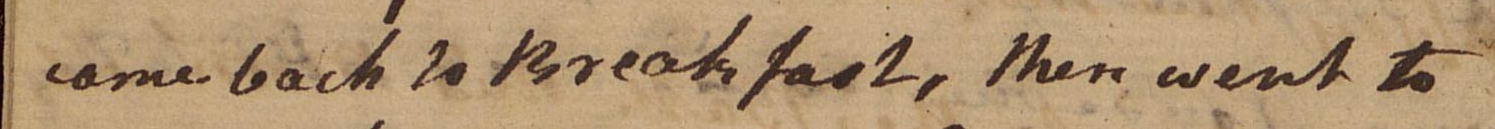came back to Breakfast, then went to
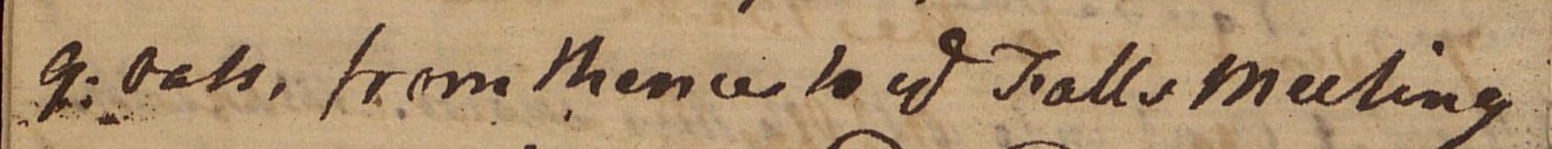G. Oats, from thence to y^e Falls Meeting
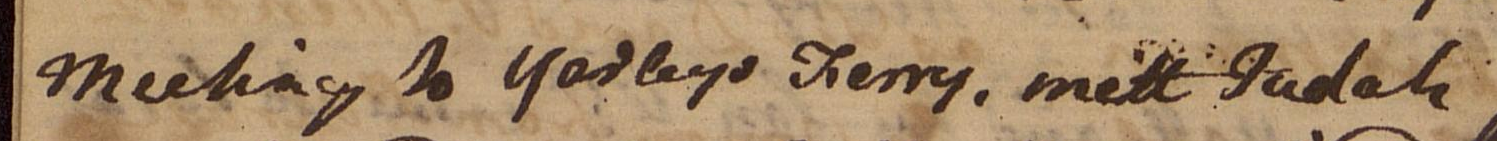Meeting to Yarleys Ferry, mett Judah
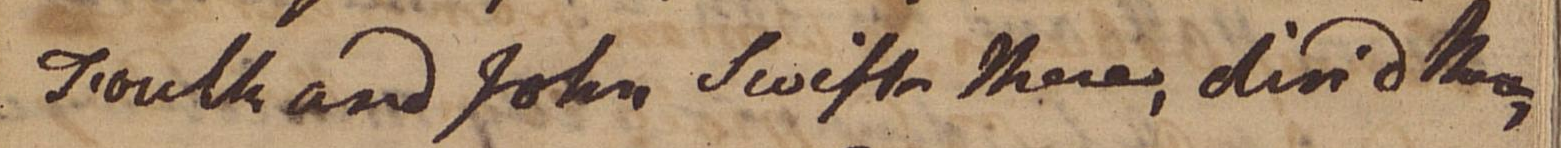Foulk and John Swift there, din'd there,
